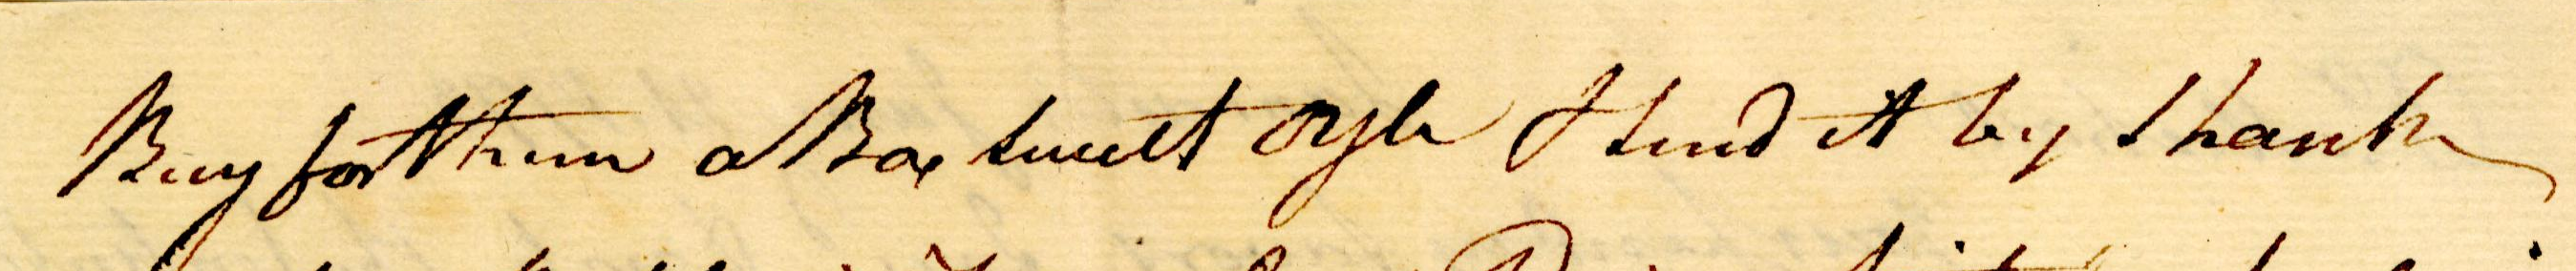Buy for them as Bo sweet oyle & send it by shank
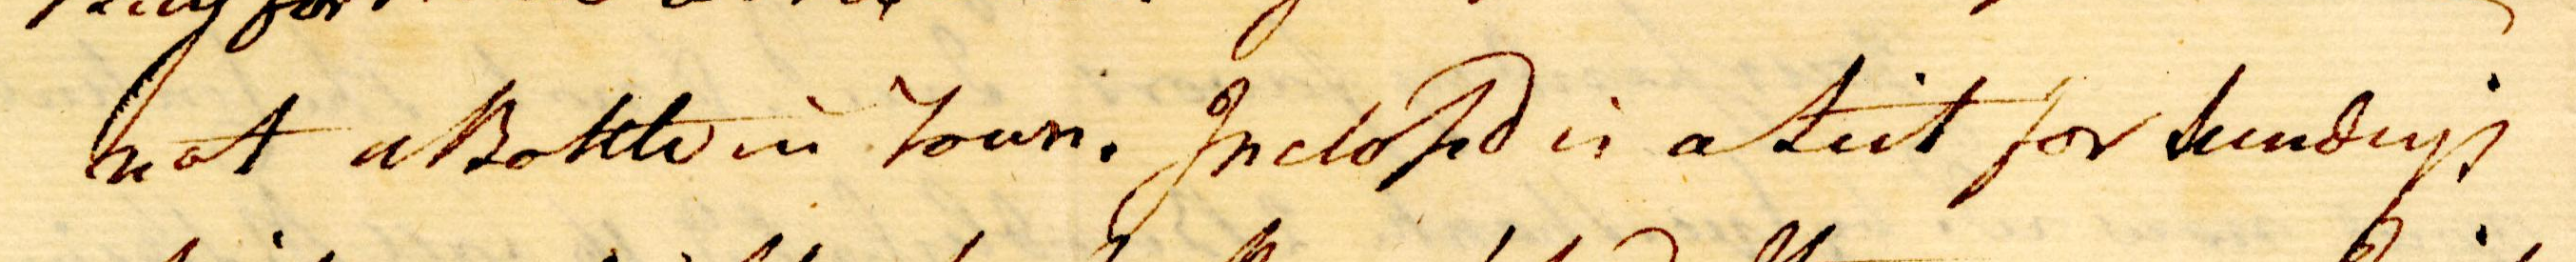not a Bottle in town. Inclosed is a list for sundrys
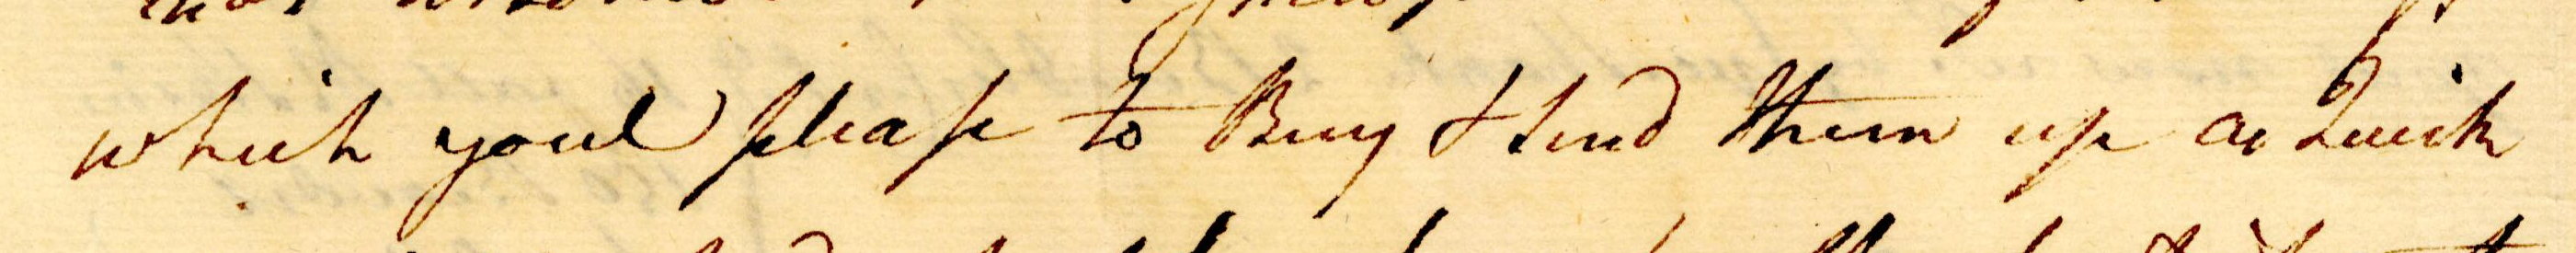which youl please to Buy & send them up as Quick
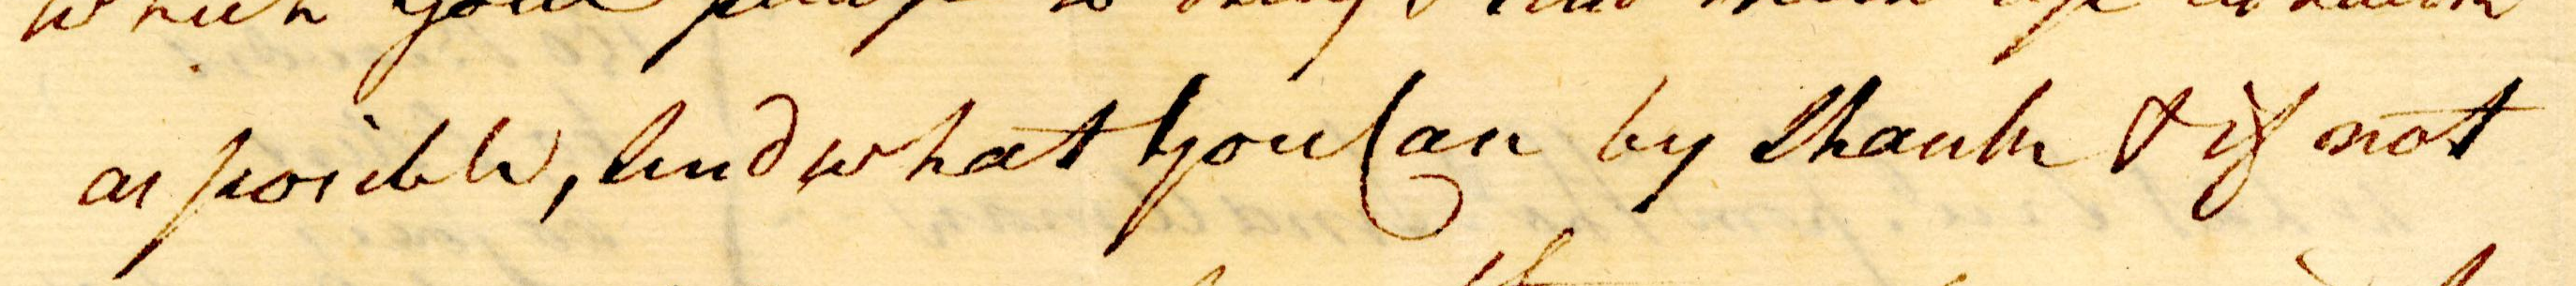as posible, send what you can by Shank & if not
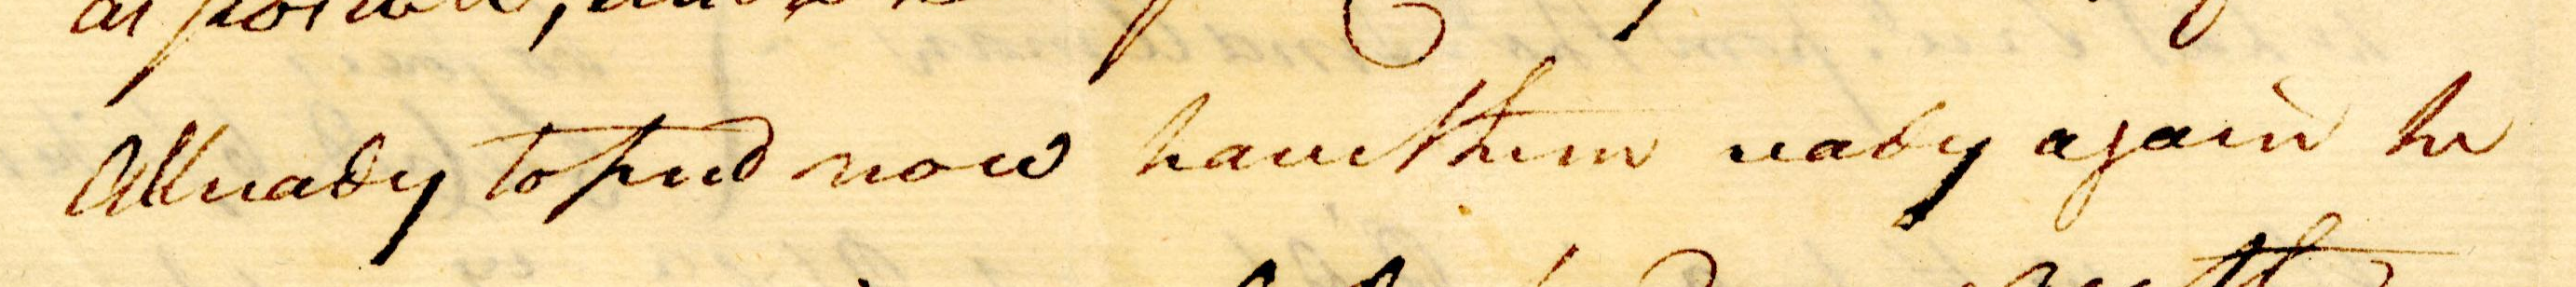Already to pud now have them ready again he
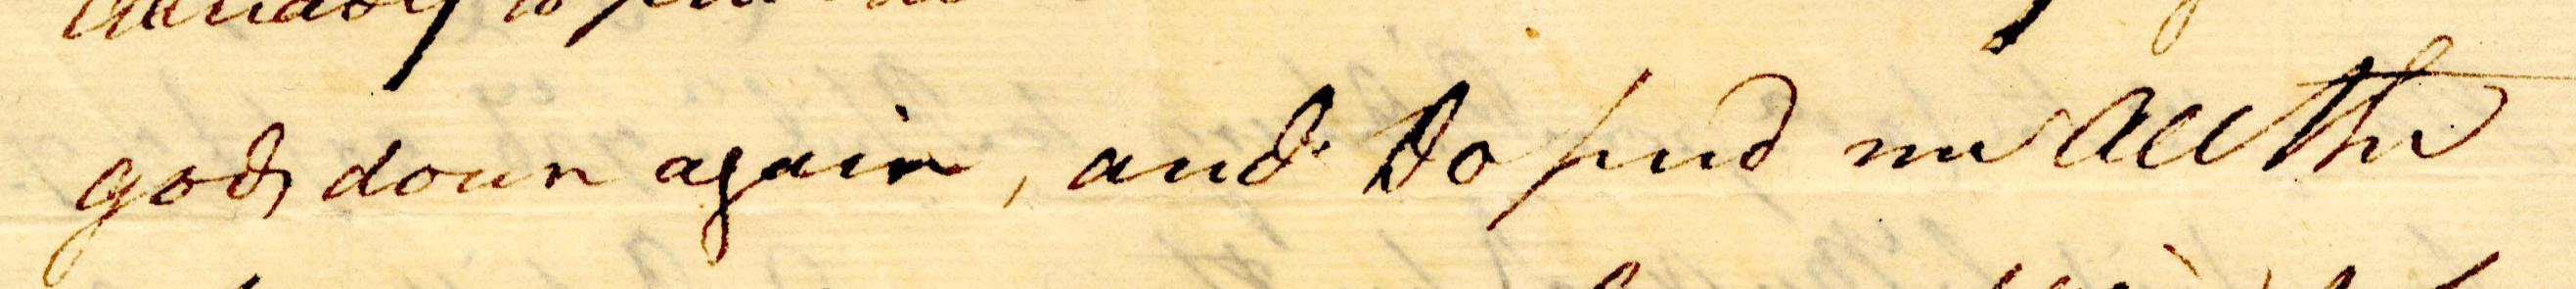goes, down again, and Do send me all the
